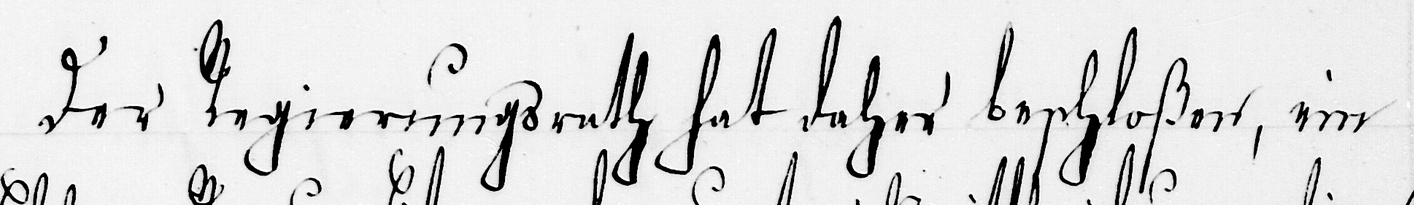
Der Regierungsrath hat daher beschloßen, ein
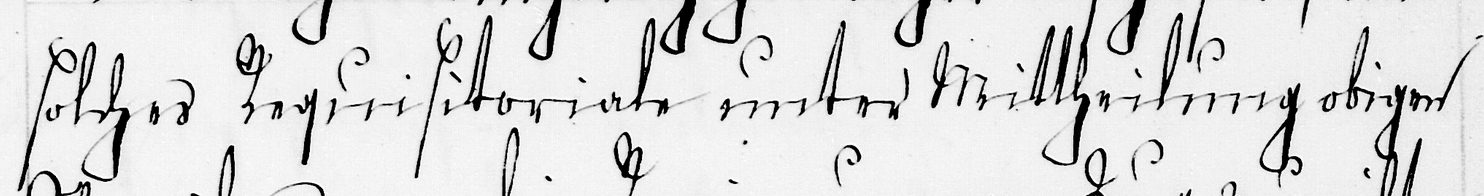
solches Requisitoriale unter Mittheilung obigen
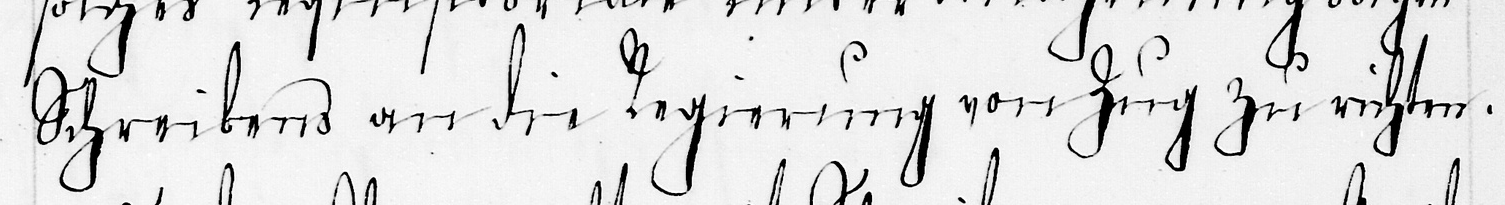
Schreibens an die Regierung von Zug zu richten.
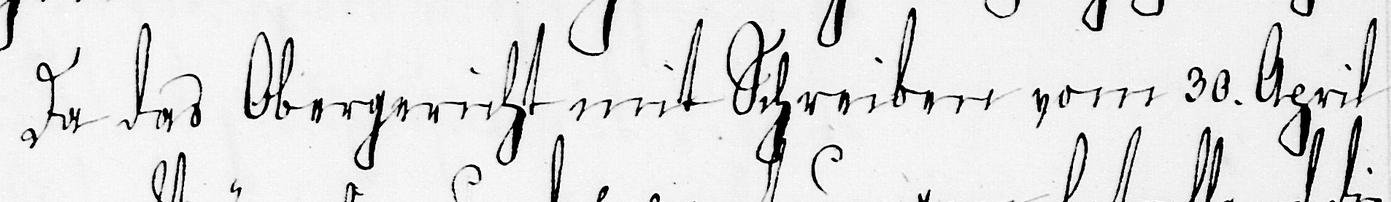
Da das Obergericht mit Schreiben vom 30. April
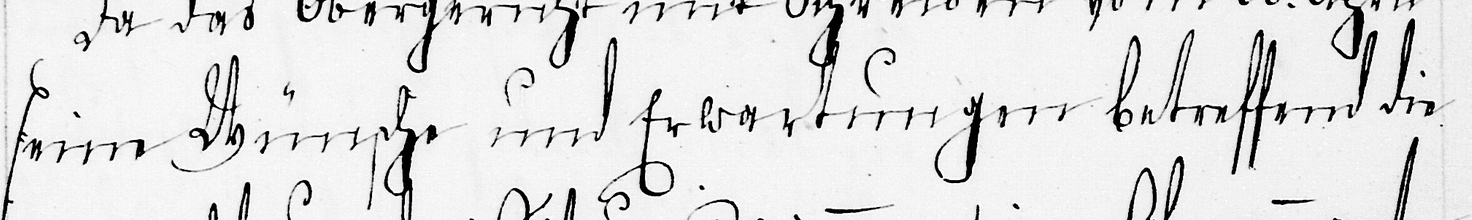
seine Wünsche und Erwartungen betreffend die
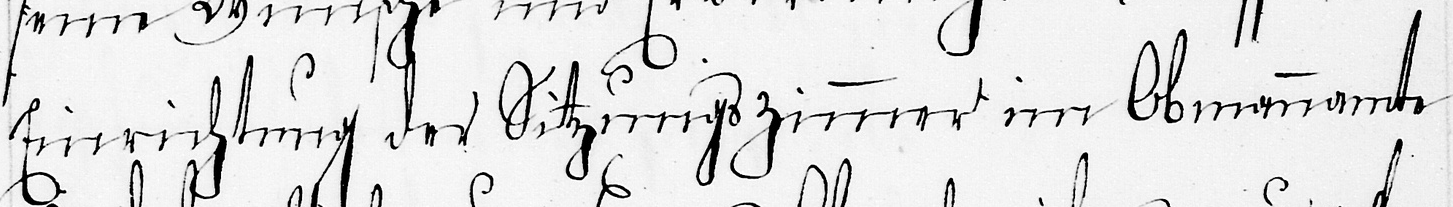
Einrichtung der Sitzungszimmer im Obmannamte
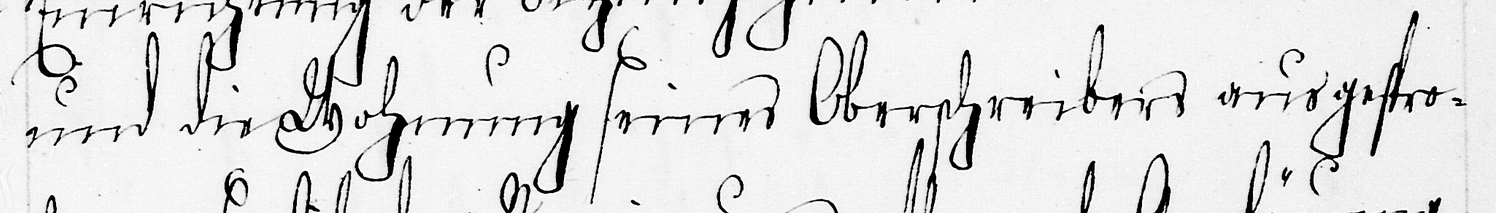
und die Wohnung eines Oberschreibers ausgespro¬
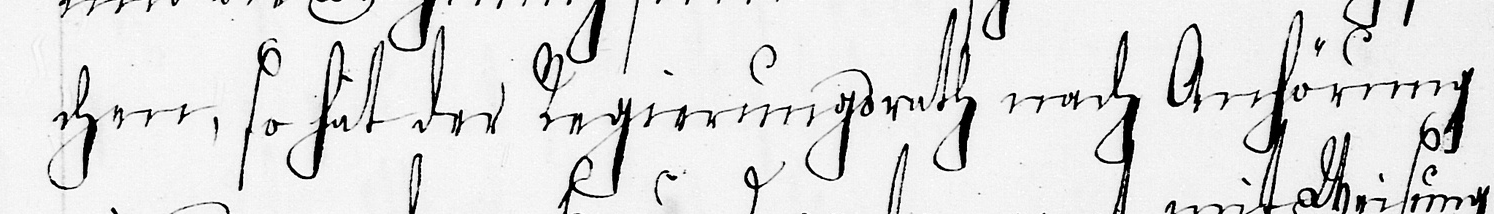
chen, so hat der Regierungsrath nach Anhörung
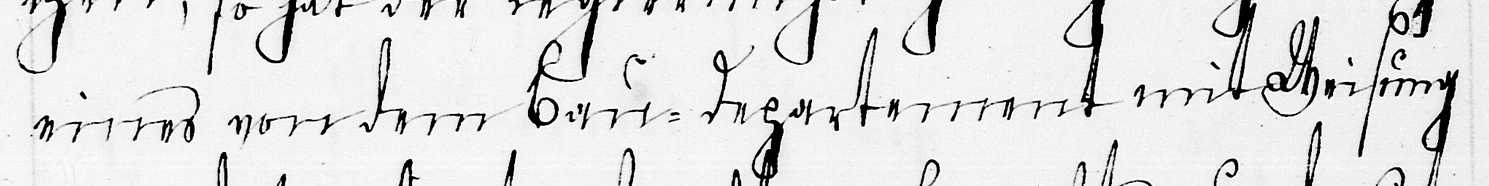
eines von dem Bau-Departement mit Weisung
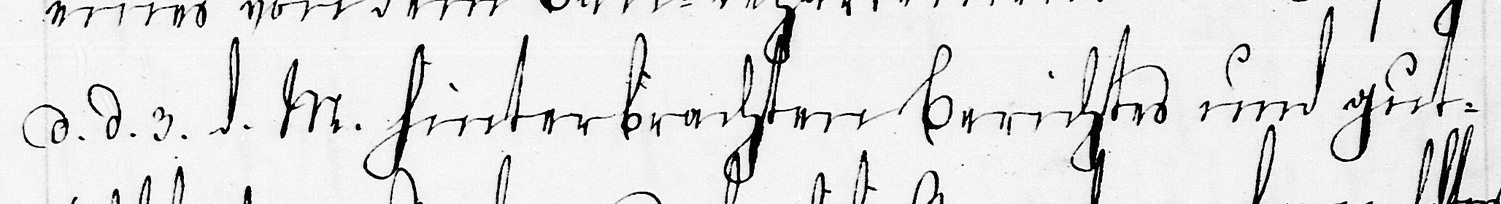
d. d. 3. d. M. hinterbrachten Berichtes und gut¬
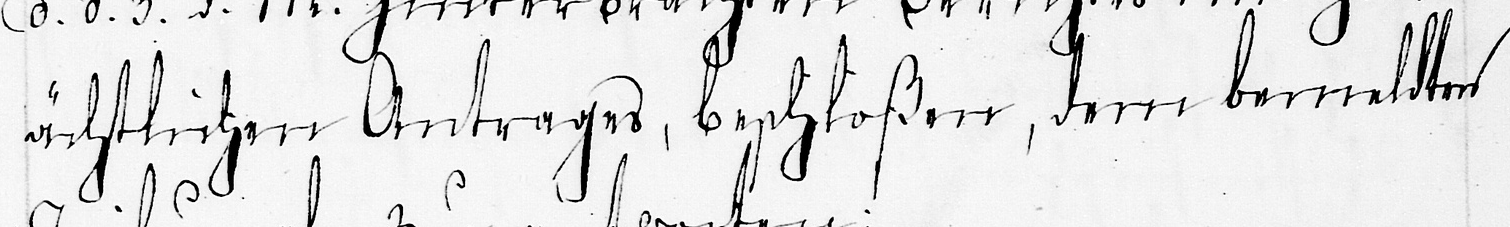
ächtlichen Antrages, beschloßen, dem bemeldten
